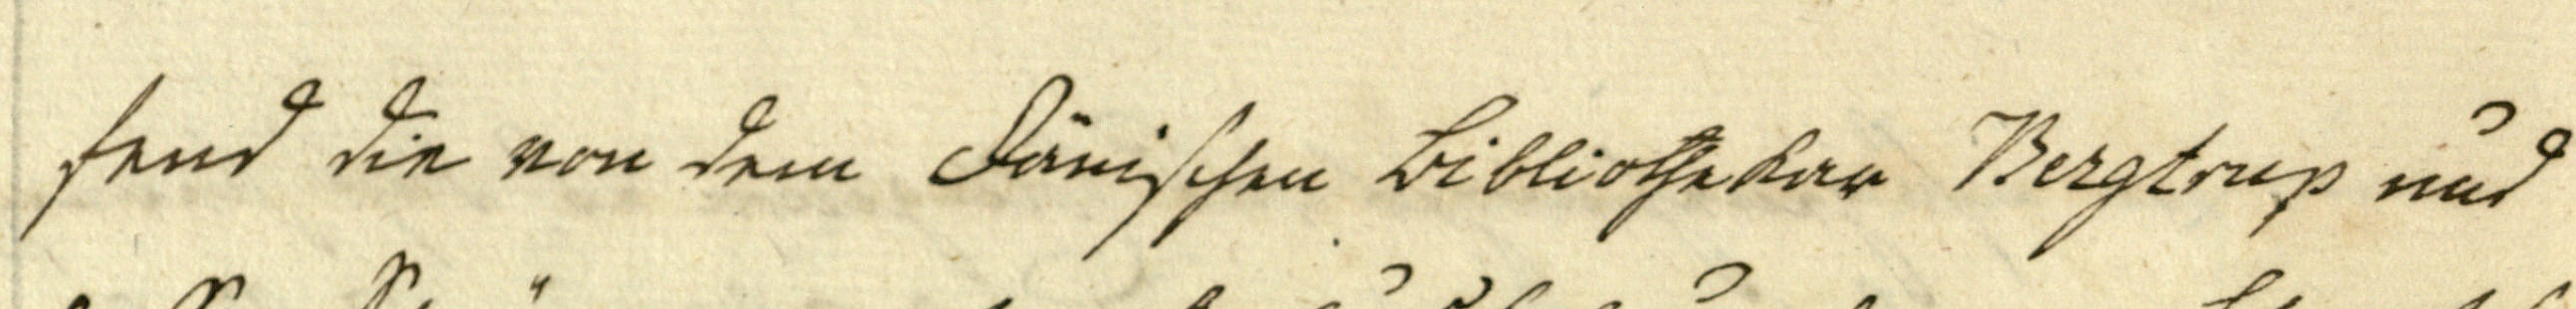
fend die von dem Dänischen Bibliothekar Bergtrup und
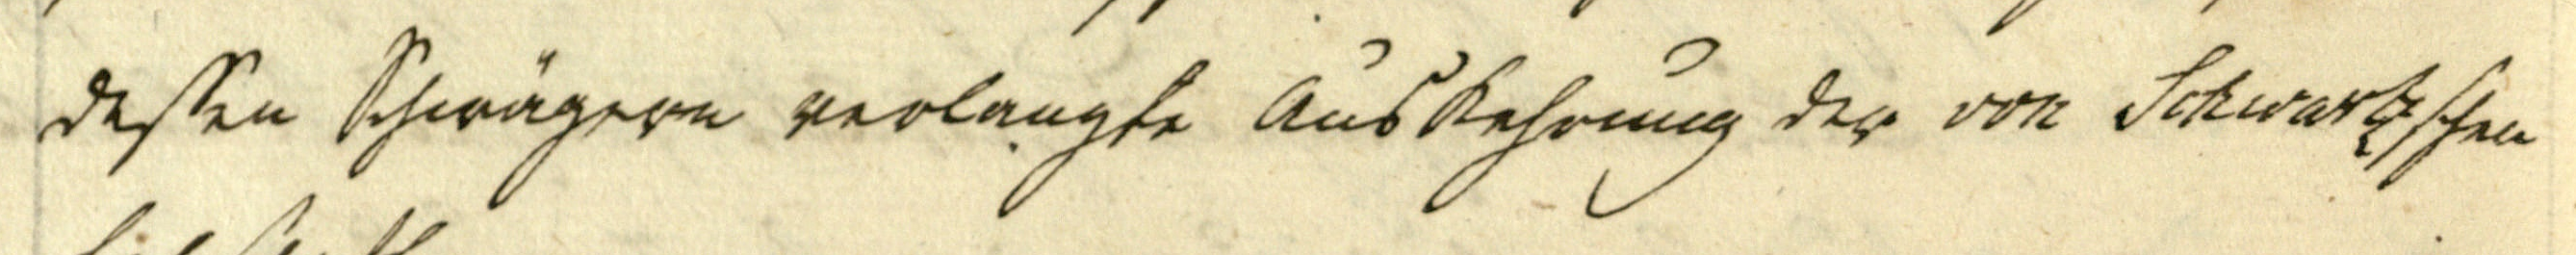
dessen Schwägern verlangte Auskehrung der von Schwartzschen
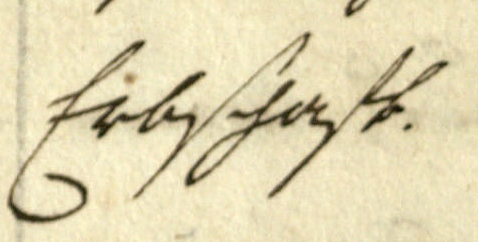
Erbschaft.
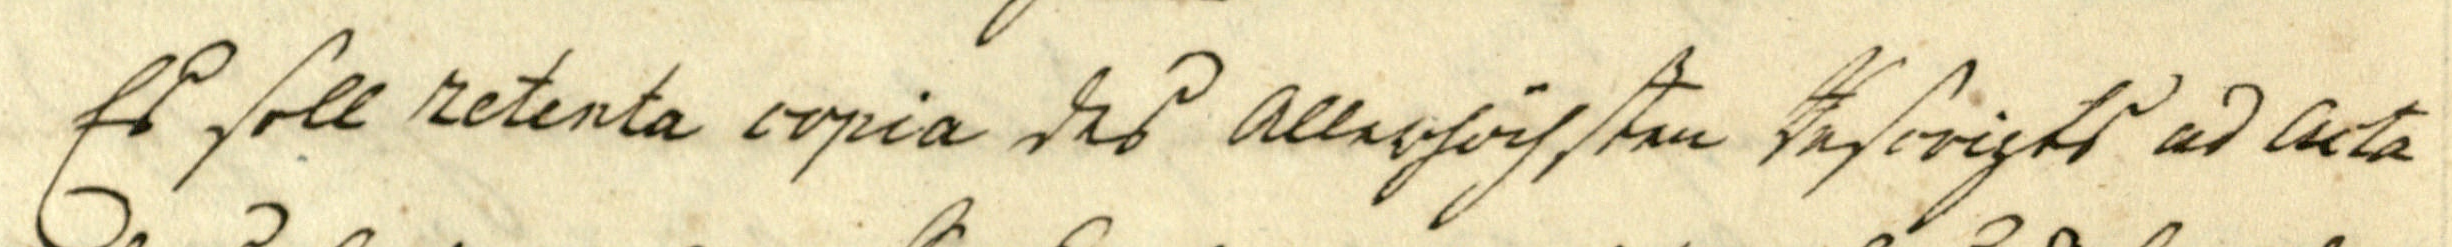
Es soll retenta copia des Allerhöchsten Rescripts ad Acta
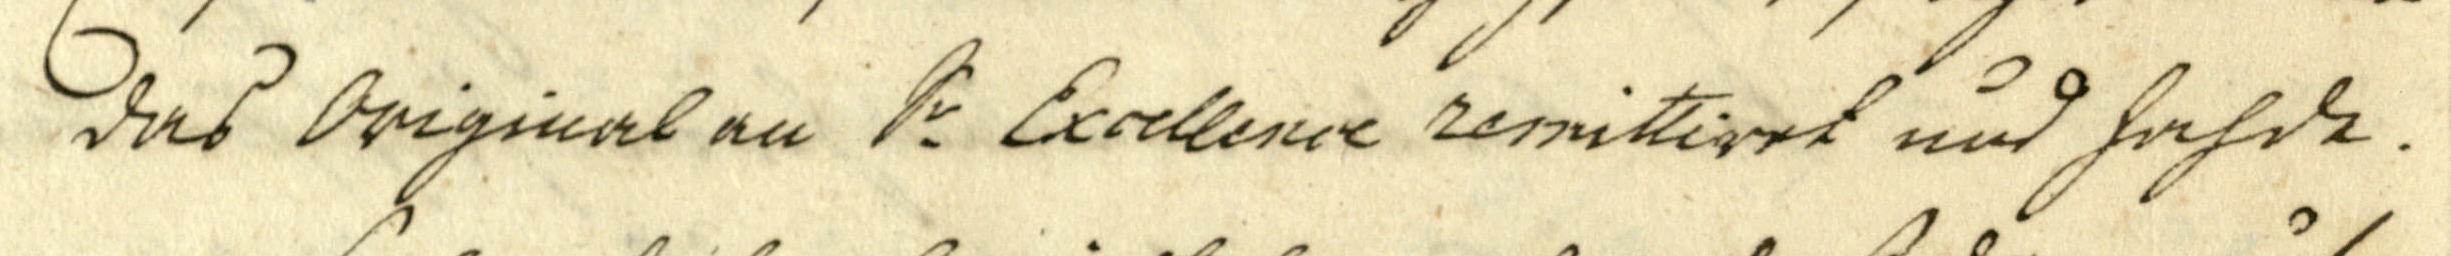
das Original an Sr Excellence remittiret und Hochde¬
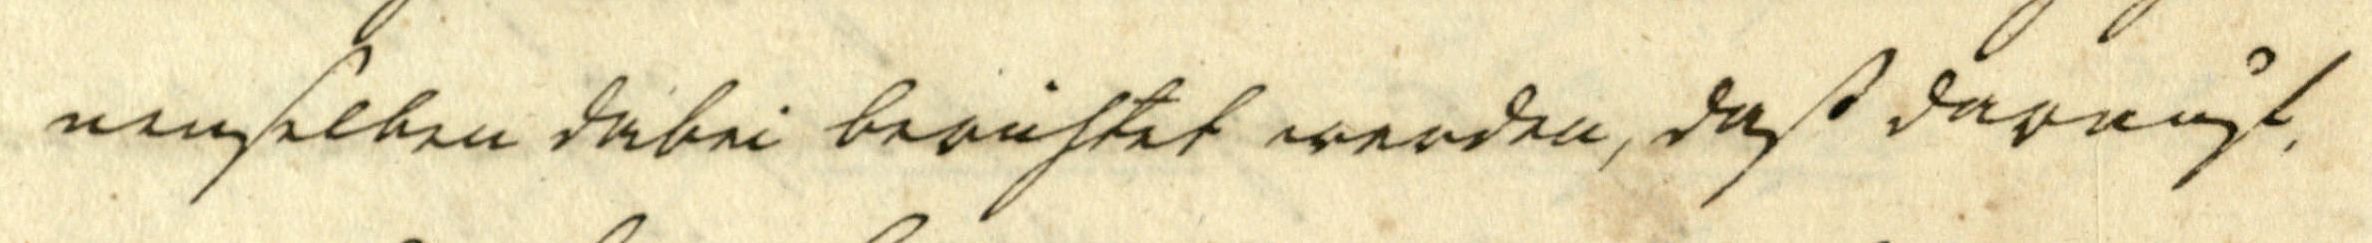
nenselben dabei berichtet werden, daß darauf,
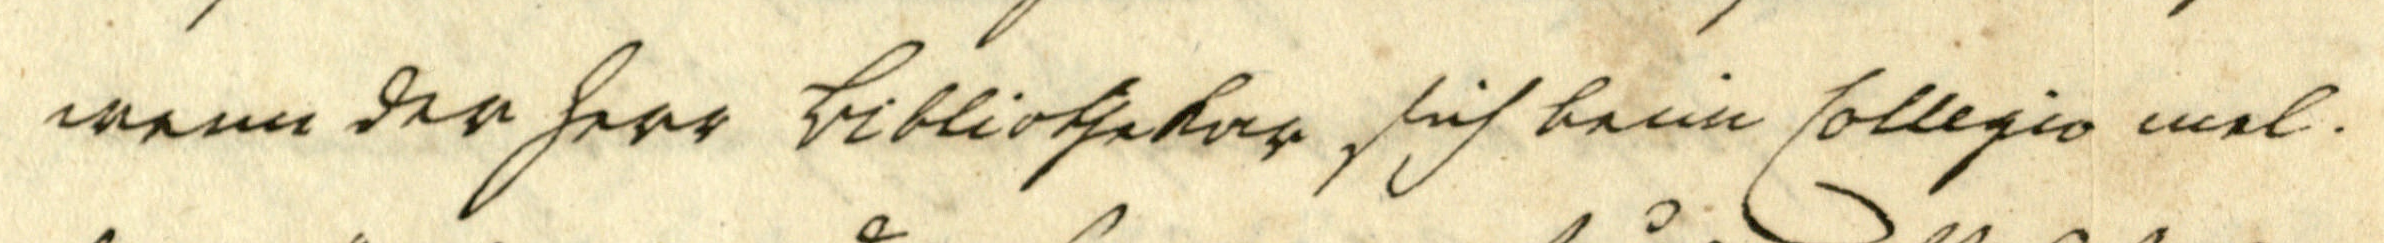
wenn der Herr Bibliothekar sich beim Collegio mel¬
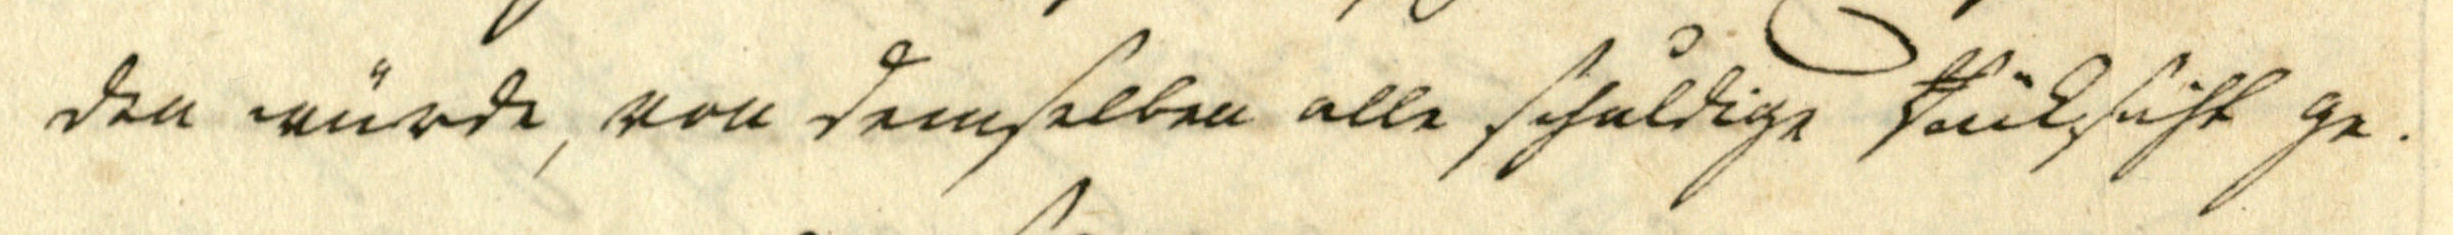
den würde, von demselben alle schuldige Rücksicht ge¬
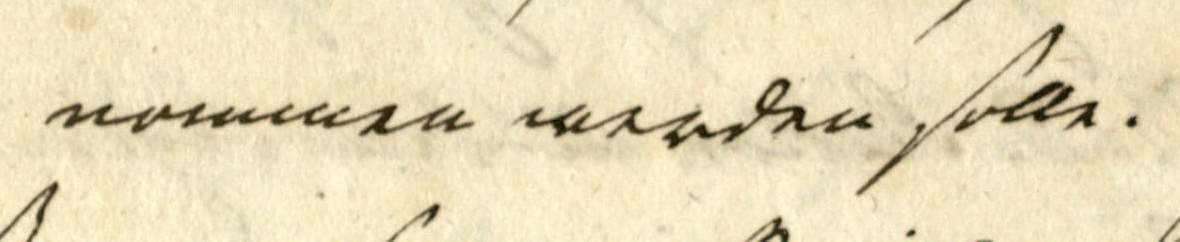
nommen werden solle.
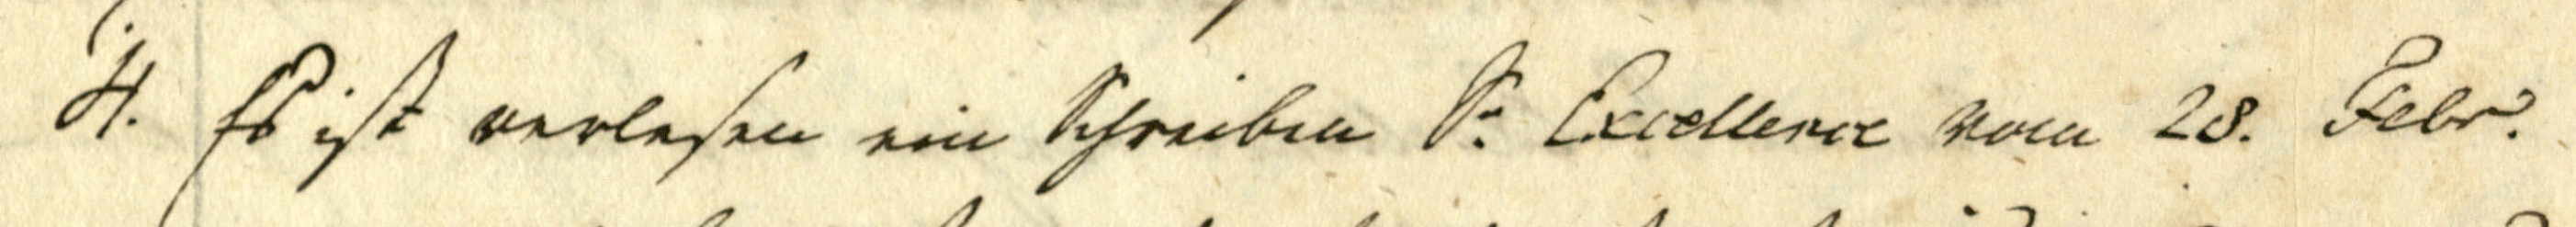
4. Es ist verlesen ein Schreiben Sr. Excellence vom 28. Febr.
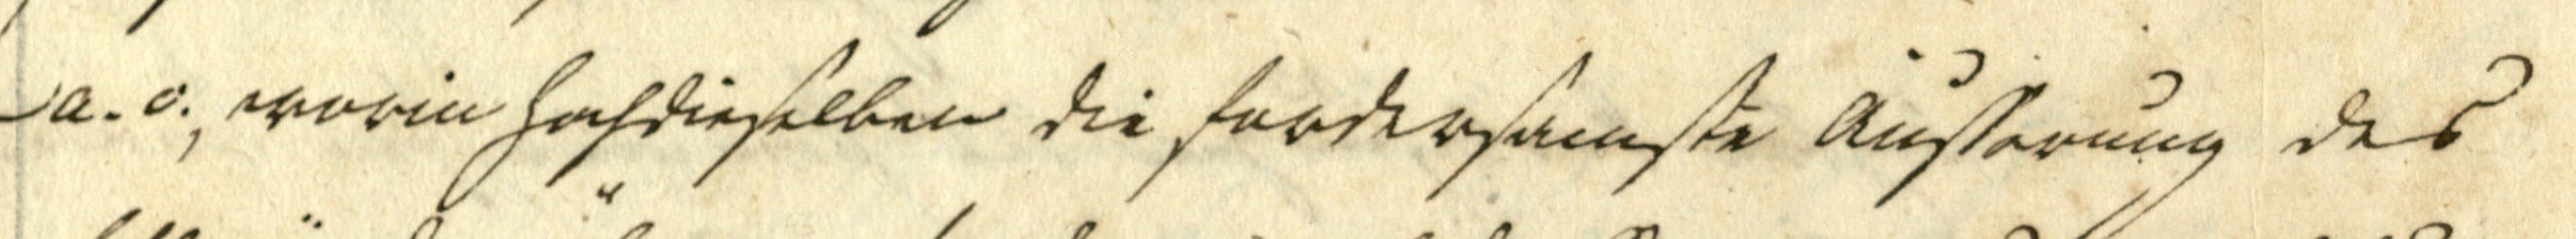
a. o., worin Hochdieselben die fordersamste Äusserung des
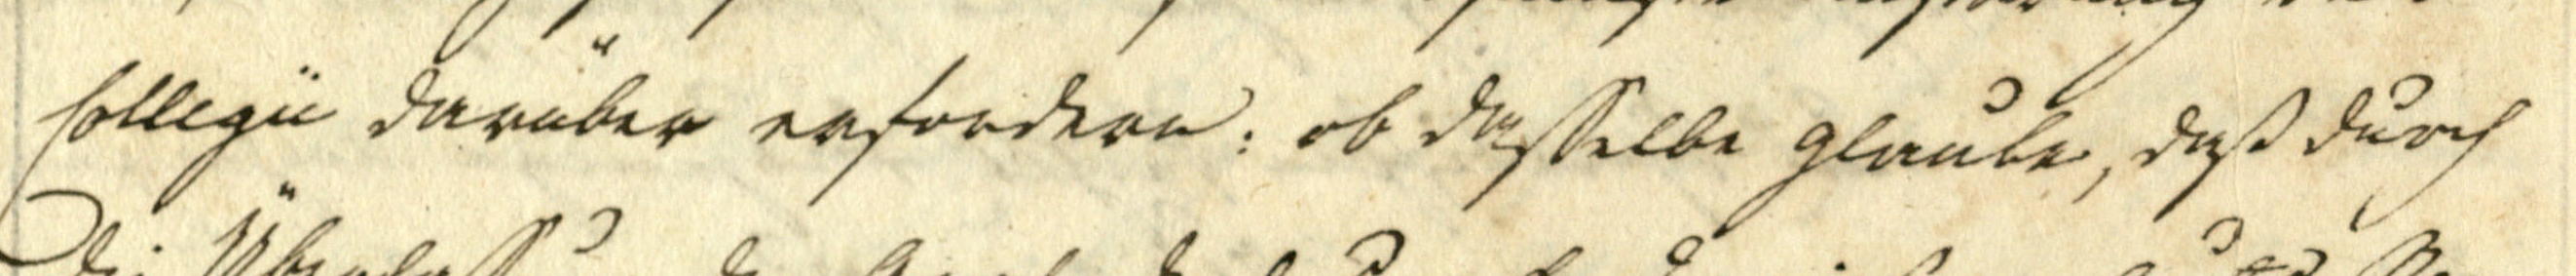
Collegii darüber erfordern: ob dasselbe glaube, daß durch
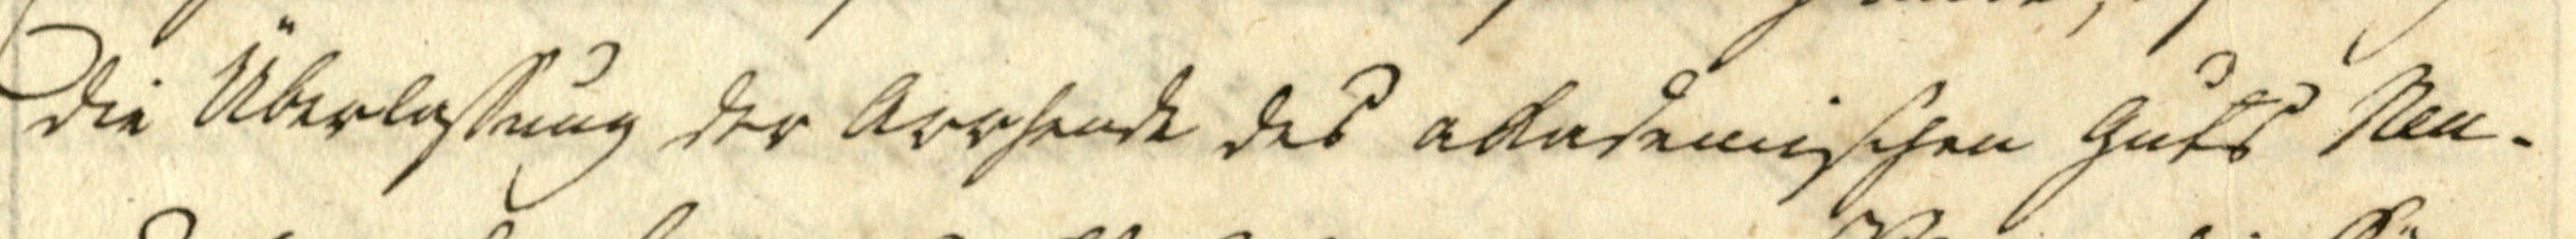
die Überlassung der Arrhende des akademischen Guts Neu¬
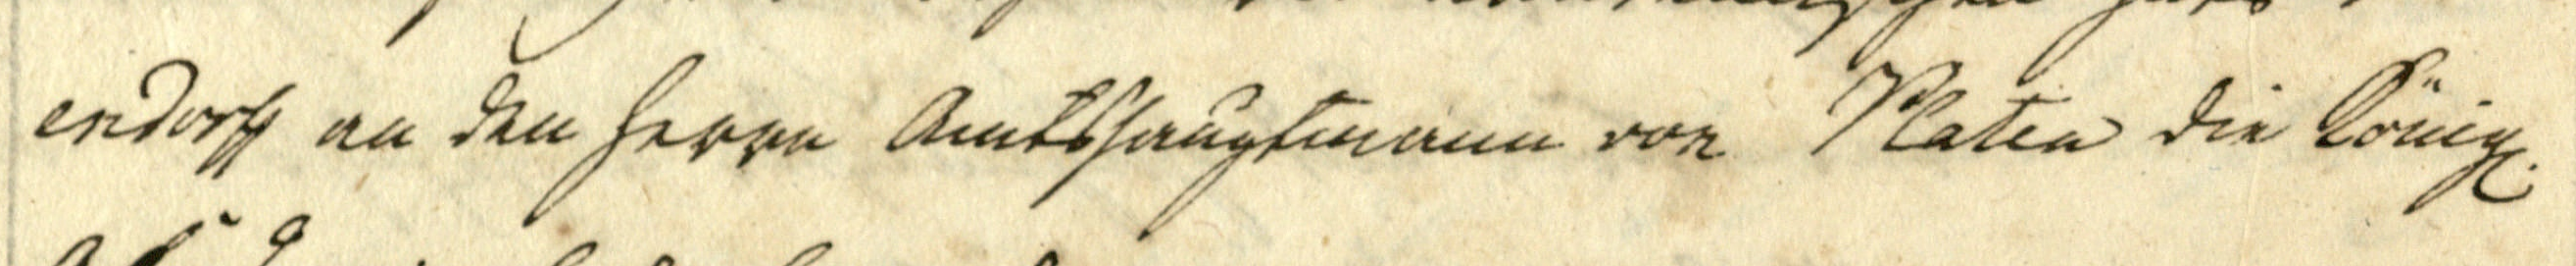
endorff an den Herrn Amtshauptmann von Platen die Königl.,
